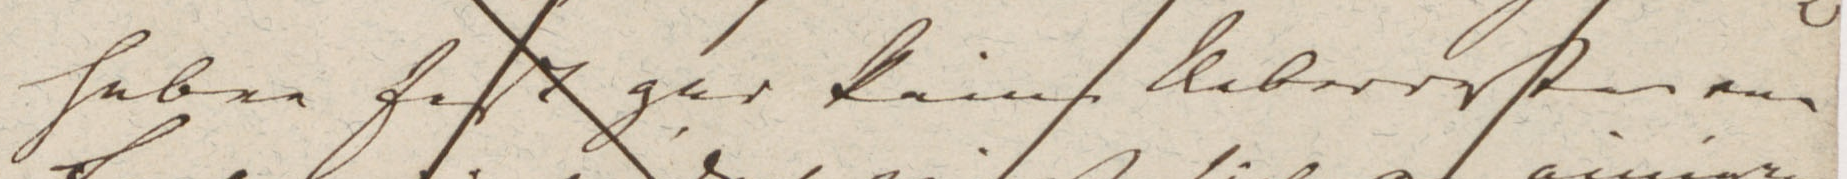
haben fast gar keine Ueberreste von
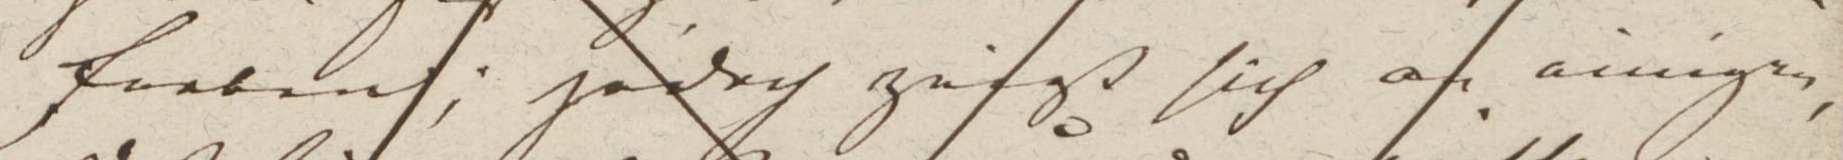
Farben; jedoch zeigt sich an einigen,
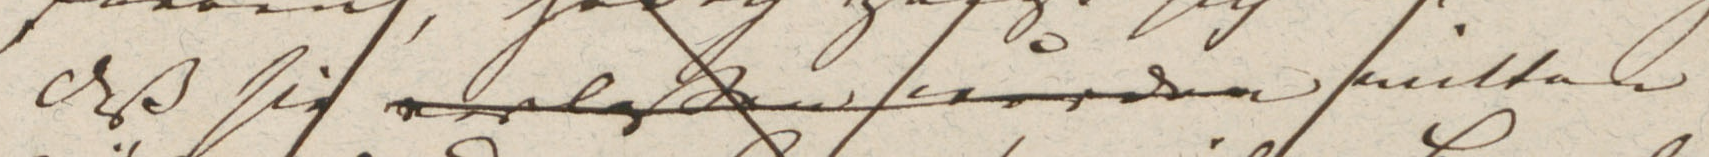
dass sie verlassen wurden mitten
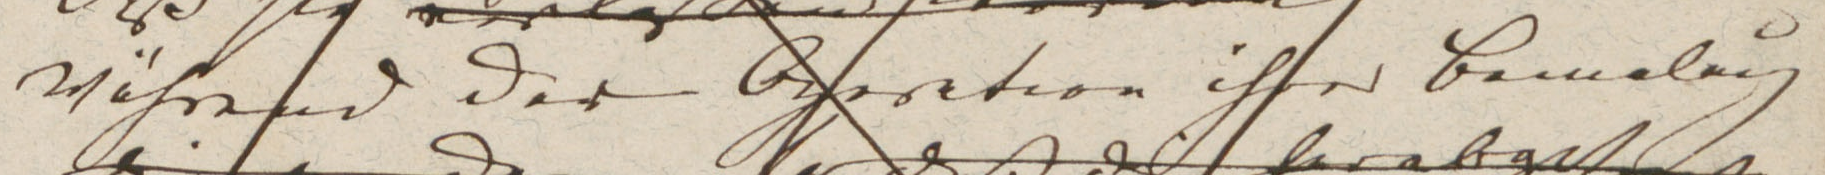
während der Operation ihrer Bemalung
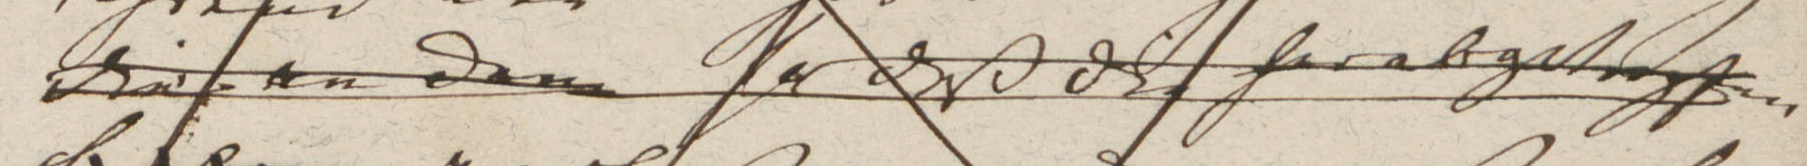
die an dem so dass die herabgetropften
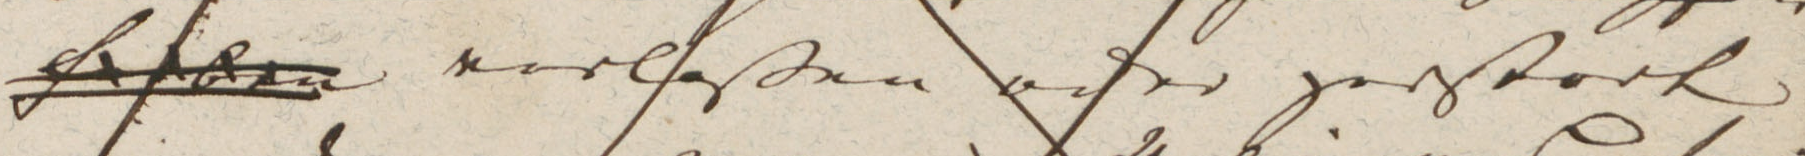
Farben verlassen oder zerstort
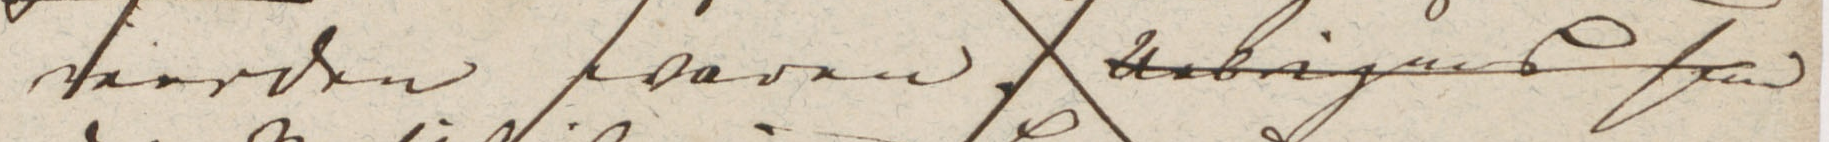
worden waren. Uebrigens sind
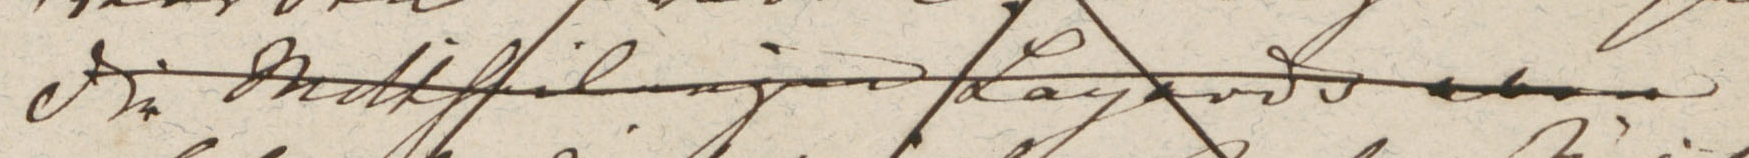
die Mittheilungen Layards aber
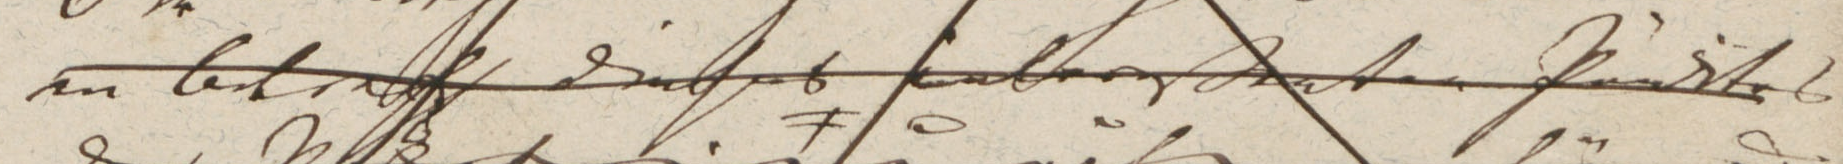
in Betracht dieses interessanten Punktes
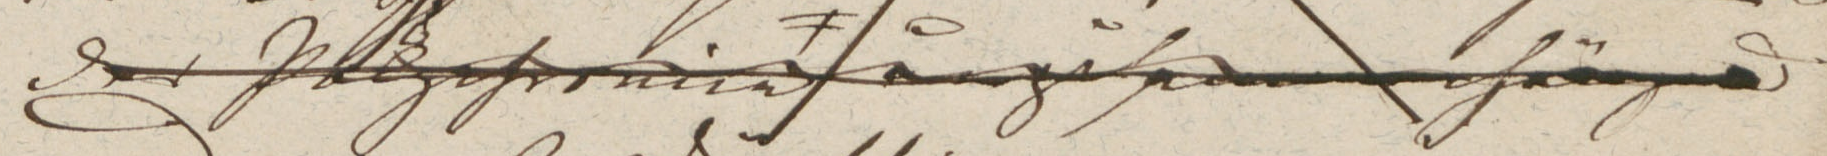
der Polychromie % unzusammenhängend
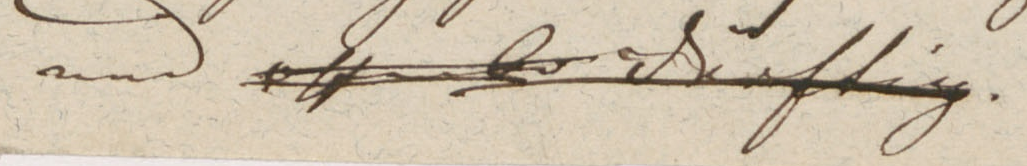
und dürftig.
